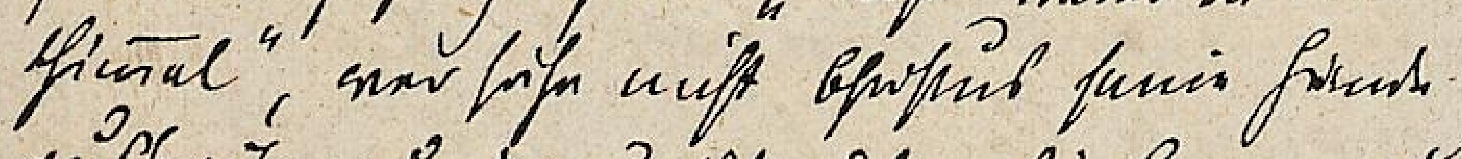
Himel", wer sähe nicht Christus seine Hände
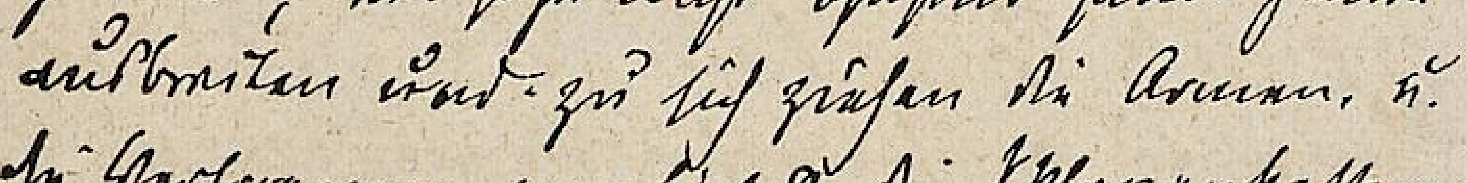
ausbreiten und zu sich ziehen die Armen u.
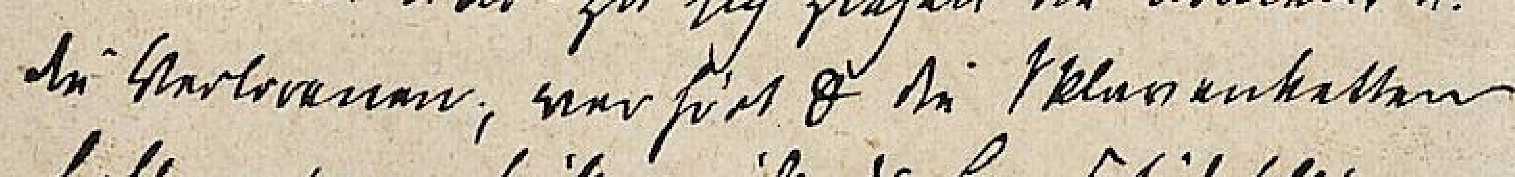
die Verlorenen, wer hört o die Sklavenketten
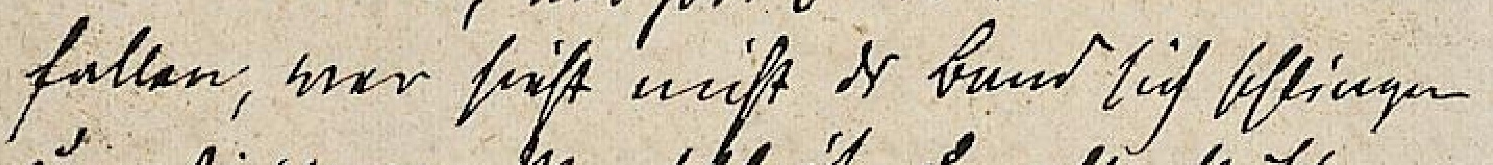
fallen, wer sieht nicht ds Band sich schlingen
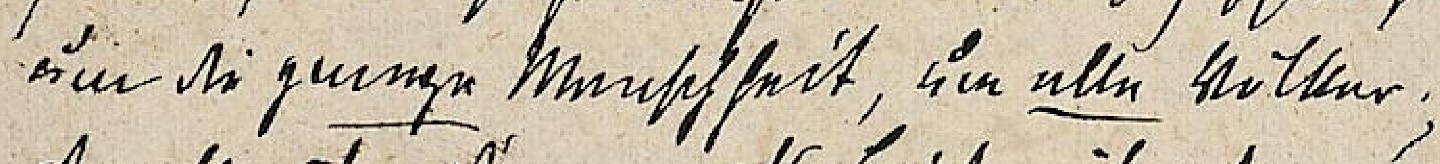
um die ganze Menschheit, um alle Völker;
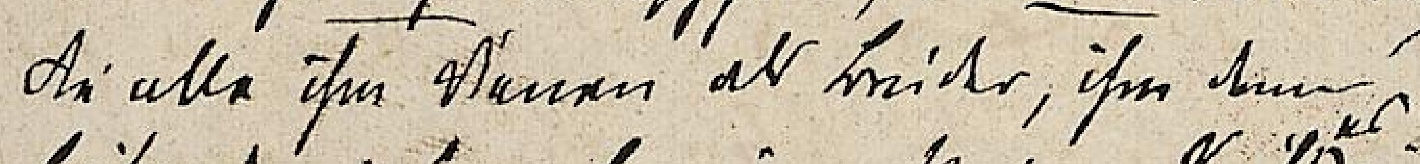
die alle ihm dienen als Brüder, ihm dem
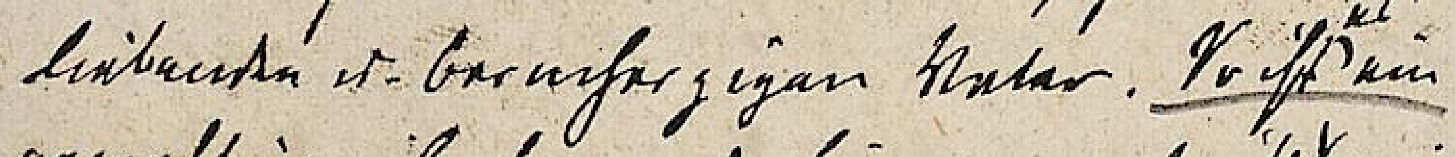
Liebenden u. barmherzigen Vater , So ist ein
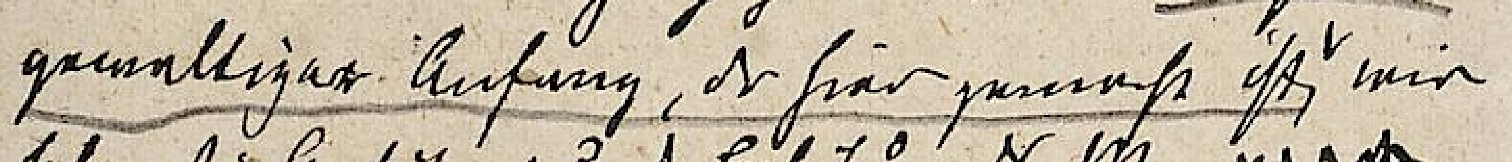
gewaltiger Anfang, dr hier gemacht ist, wir
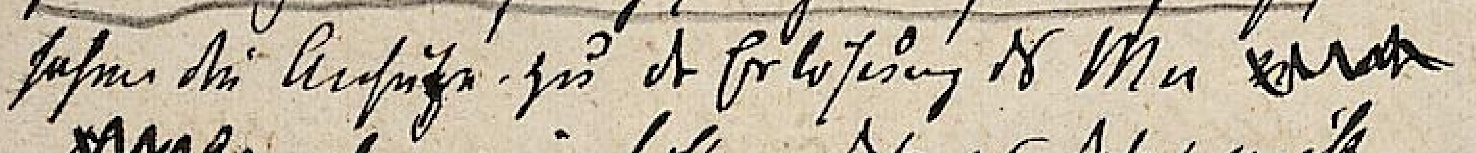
sehen die Ansätze zu dr Erlösung ds Mn v. dr.
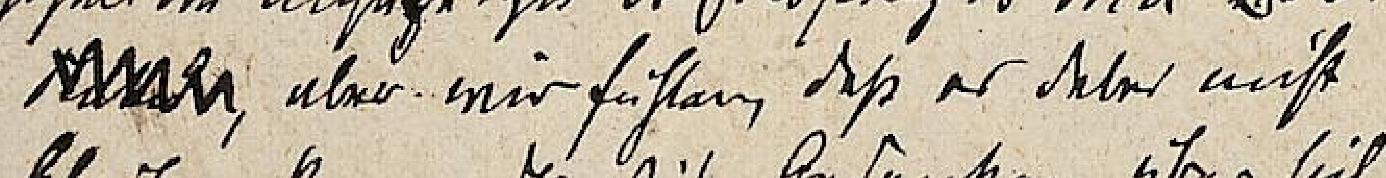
Noth, aber wir fühlen, daß es dabei nicht
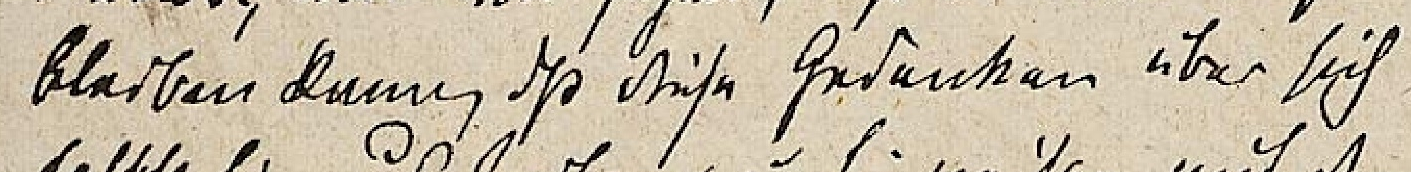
bleiben kann, dß diese Gedanken über sich
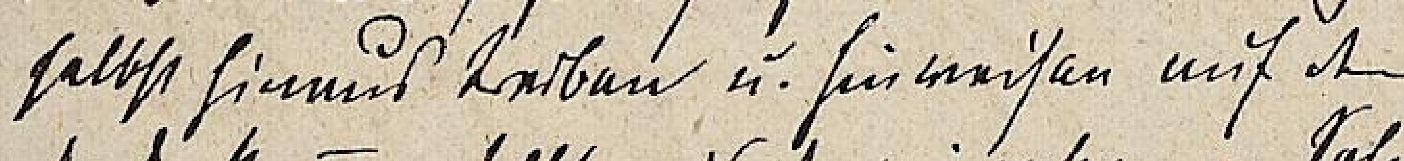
selbst hinaus treiben u. hinweisen auf den
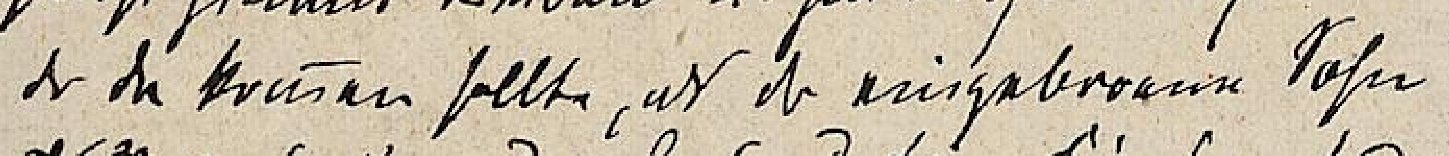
der da komen sollte, als der eingeborene Sohn
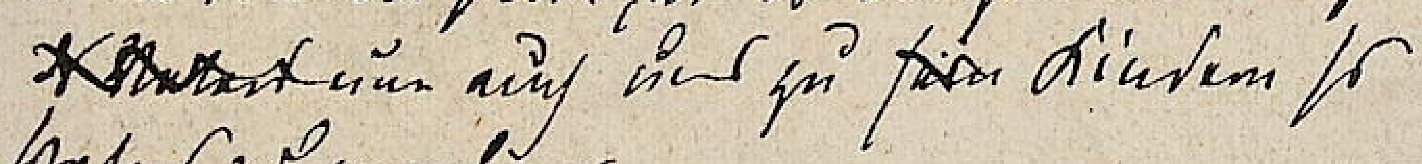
ds Vaters um auch uns zu sein Kindern ss
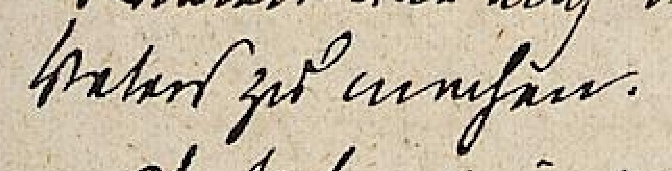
Vaters zu machen.
